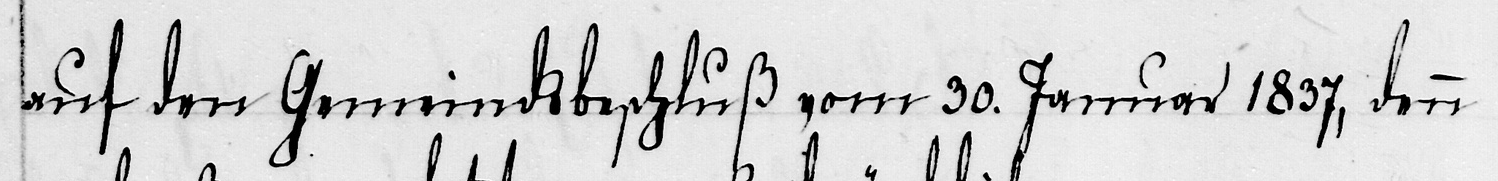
auf den Gemeindsbeschluß vom 30. Januar 1837, denn
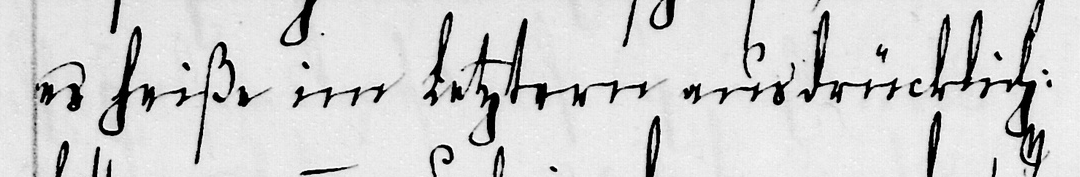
es heiße im Letztern ausdrücklich:
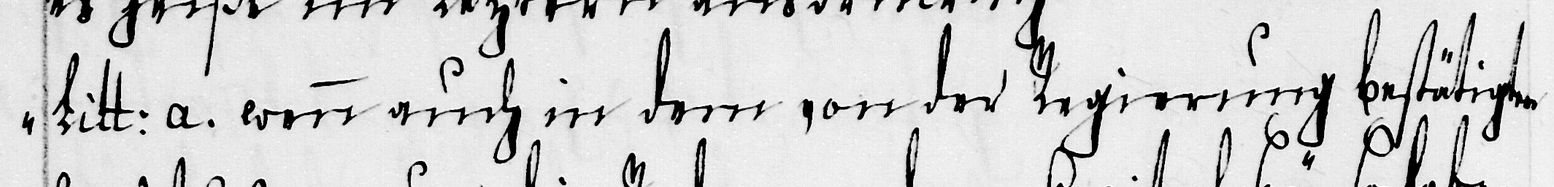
„Litt: a. wenn auch in dem von der Regierung bestätigten
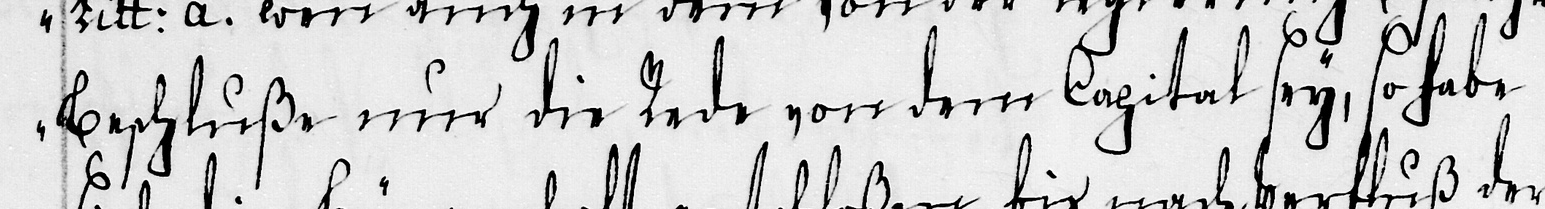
Beschluße nur die Rede von dem Capital sey, so habe
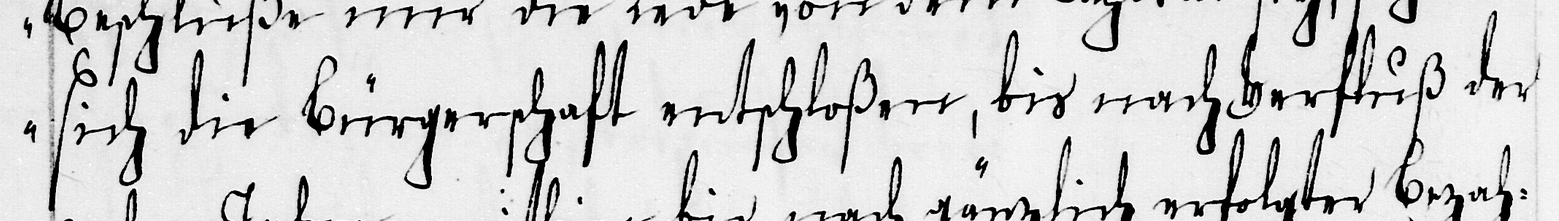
sich die Bürgerschaft entschloßen, bis nach Verfluß der
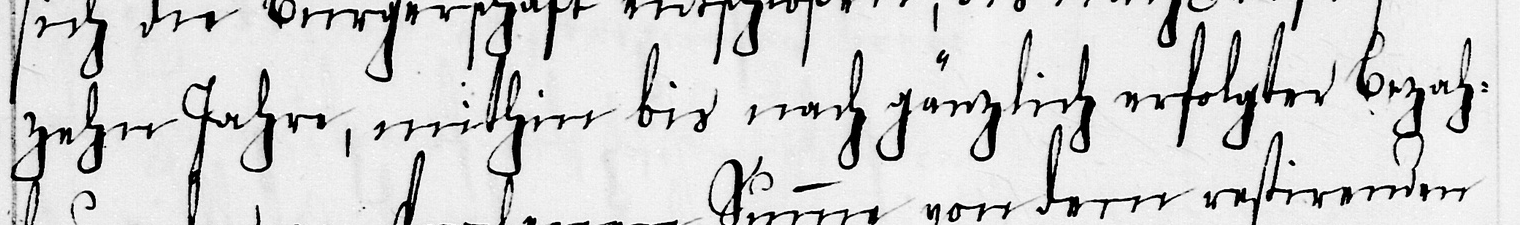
zehn Jahre, mithin bis nach gänzlich erfolgter Bezah¬
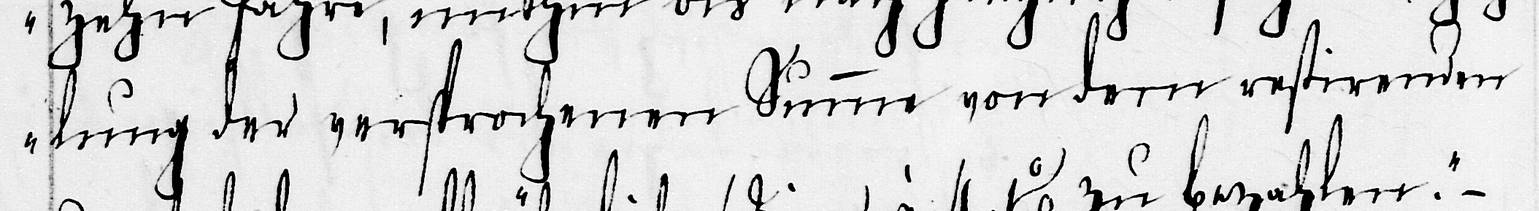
lung der versprochenen Summe von dem restirenden
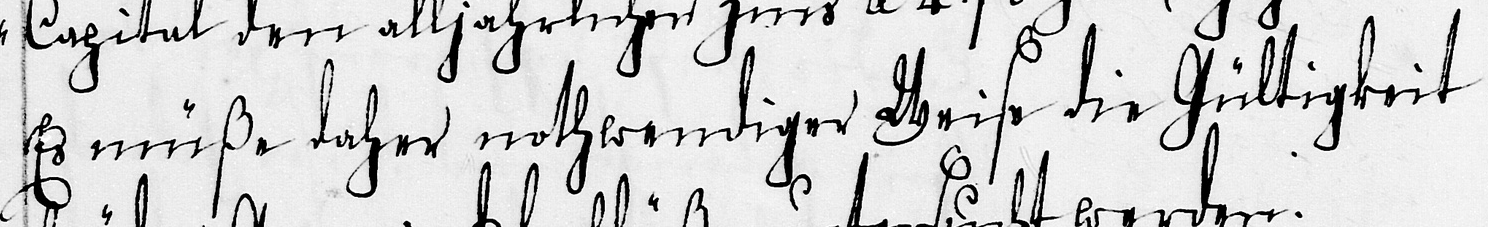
Es müße daher nothwendiger Weise die Gültigkeit
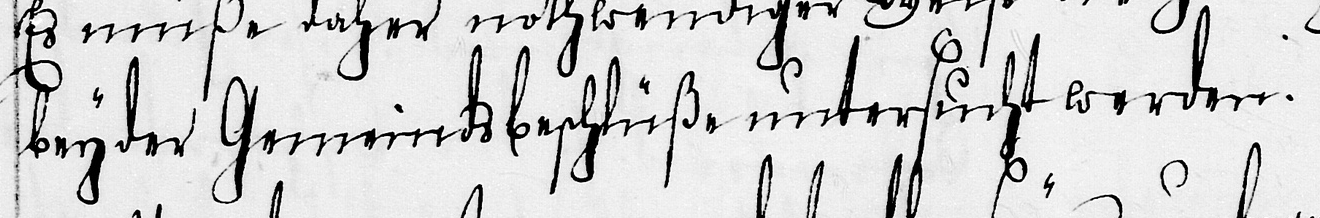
beyder Gemeindsbeschlüße untersucht werden.
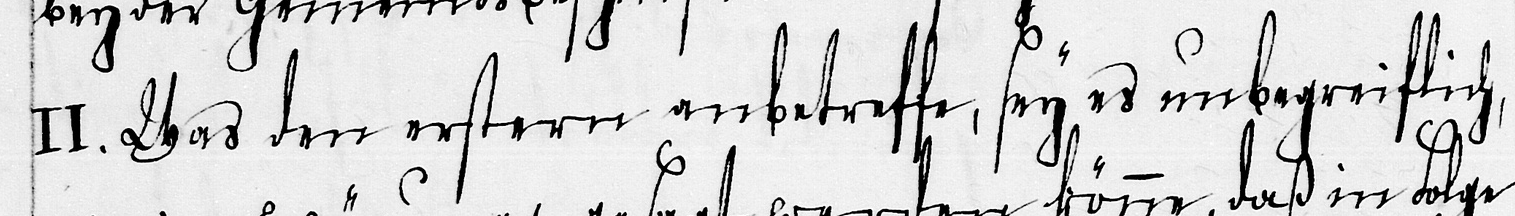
II. Was den erstern anbetreffe, sey es unbegreiflic¬
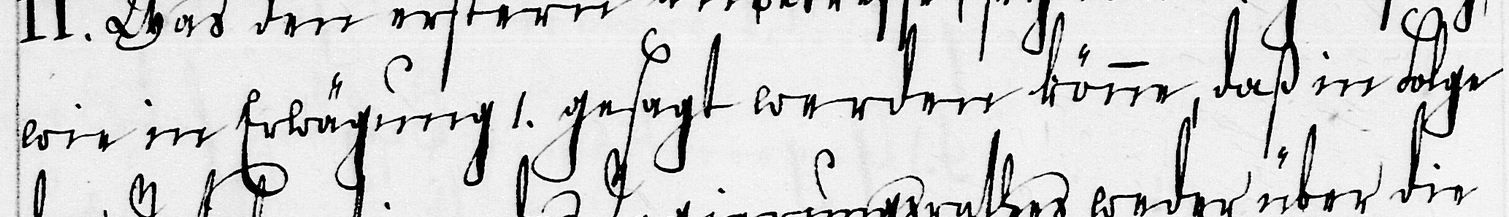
wie in Erwägung I. gesagt werden könne, daß in Folge
